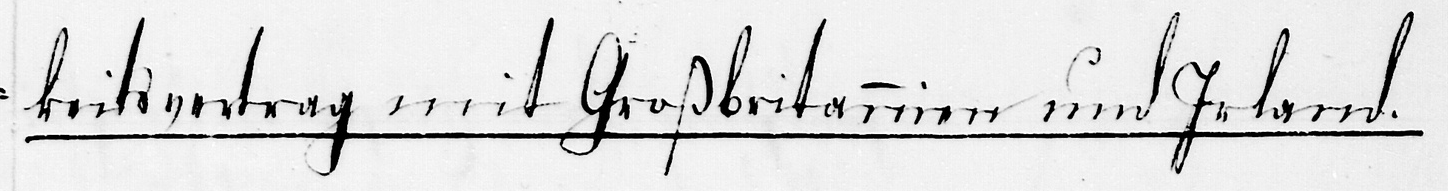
keitsvertrag mit Großbritannien und Irland.
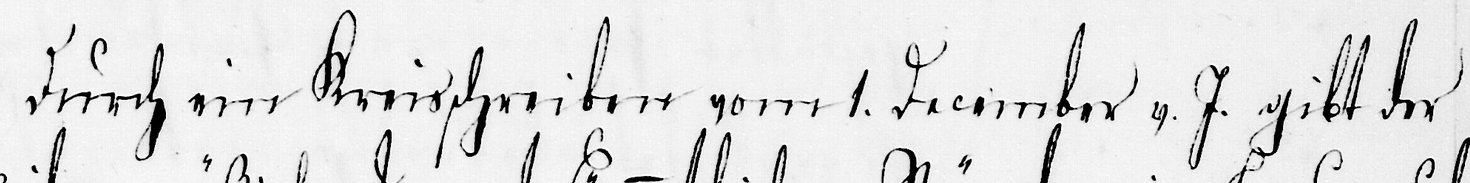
Durch ein Kreisschreiben vom 1. December v. J. gibt der
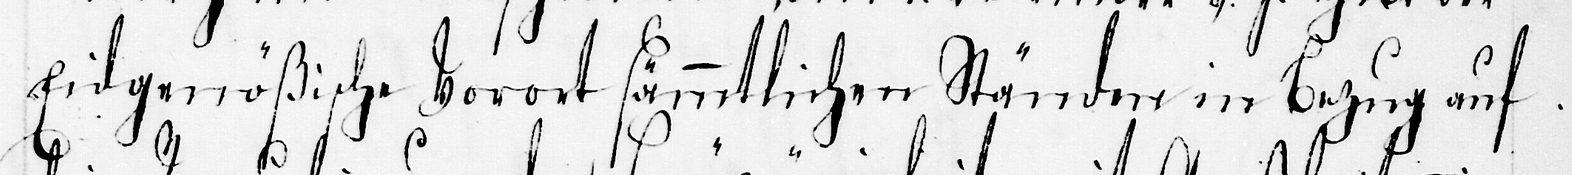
Eidgenößische Vorort sämmtlichen Ständen in Bezug auf
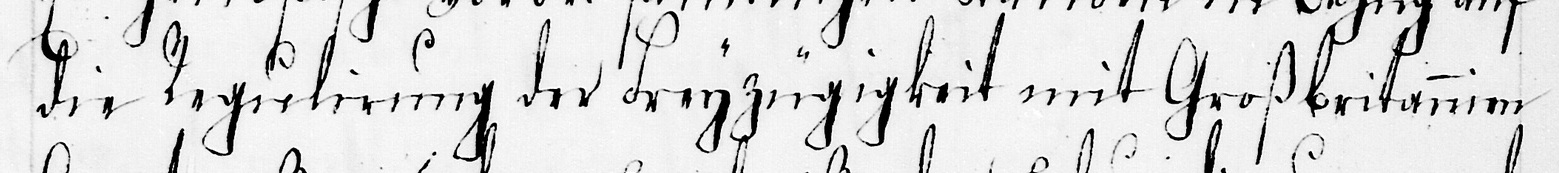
die Regulirung der Freyzügigkeit mit Großbritannien
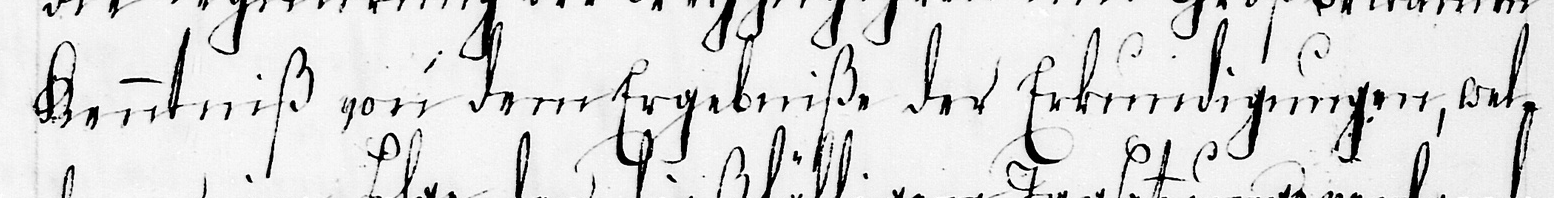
Kenntniß von dem Ergebniße der Erkundigungen, wel¬
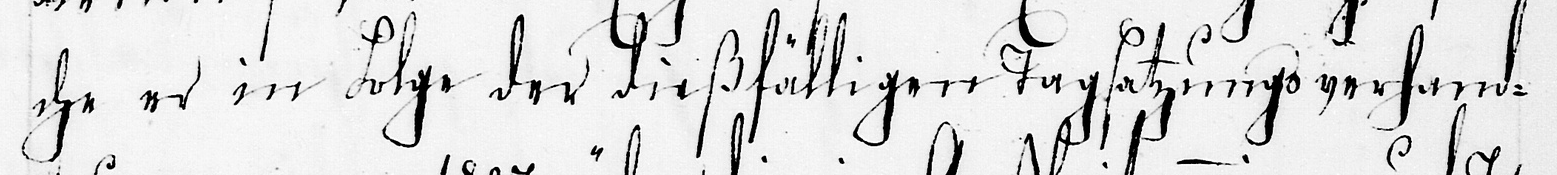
che er in Folge der dießfälligen Tagsatzungsverhand¬
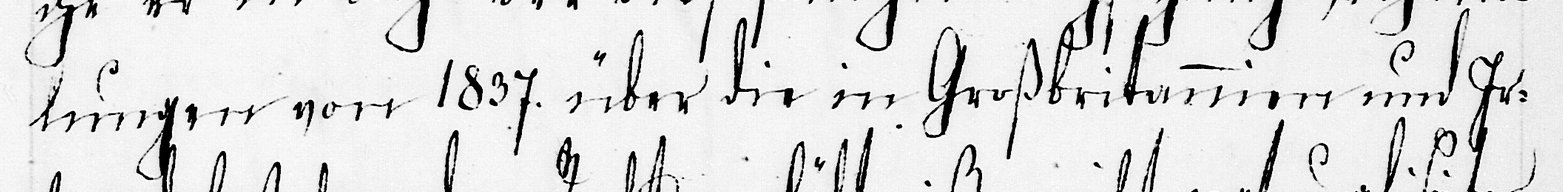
lungen von 1837. über die in Großbritannien und Ir¬
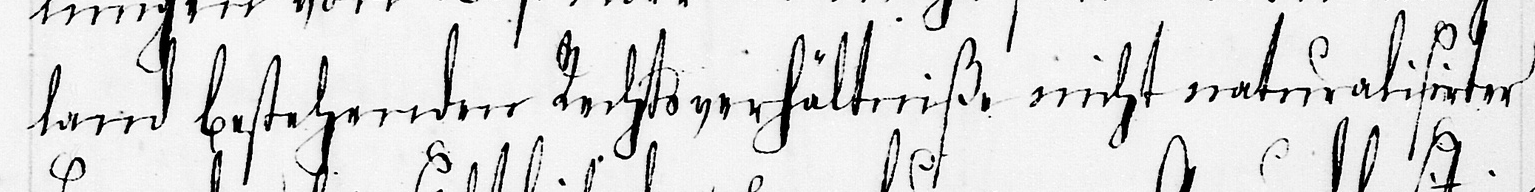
land bestehenden Rechtsverhältniße nicht naturalisirter
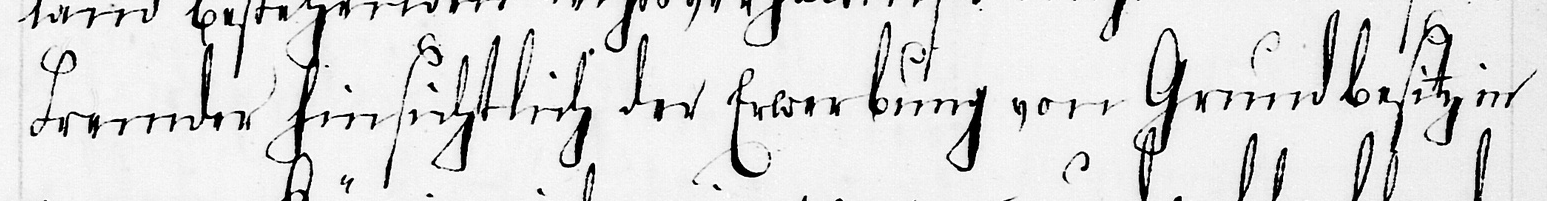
Fremder hinsichtlich der Erwerbung von Grundbesitz in
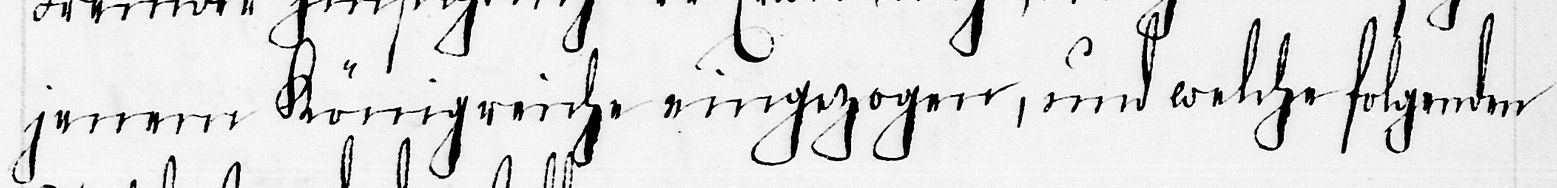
jenem Königreiche eingezogen, und welche folgenden
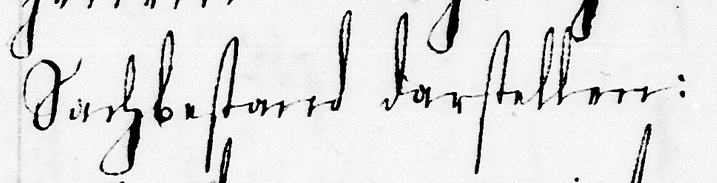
Sachbestand darstellen:
